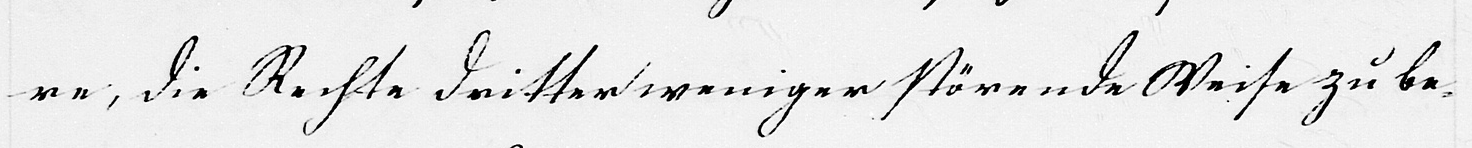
re, die Rechte dritter weniger störende Weise zu be¬
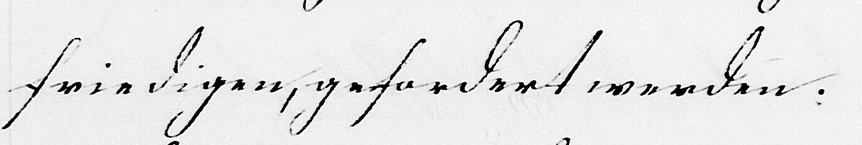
friedigen, gefordert werden:
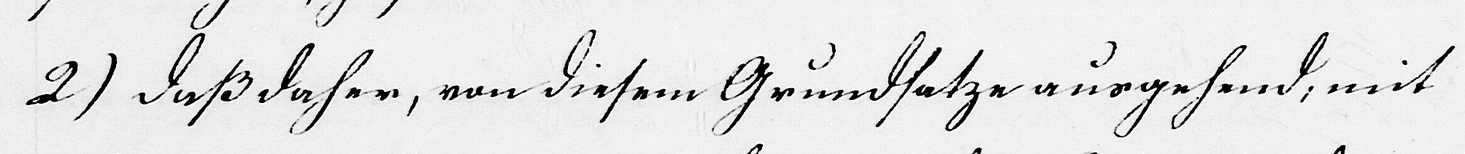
2) Daß daher, von diesem Grundsatze ausgehend, mit
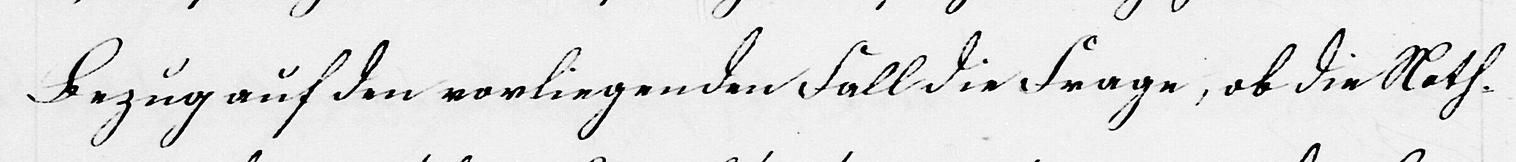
Bezug auf den vorliegenden Fall die Frage, ob die Noth¬
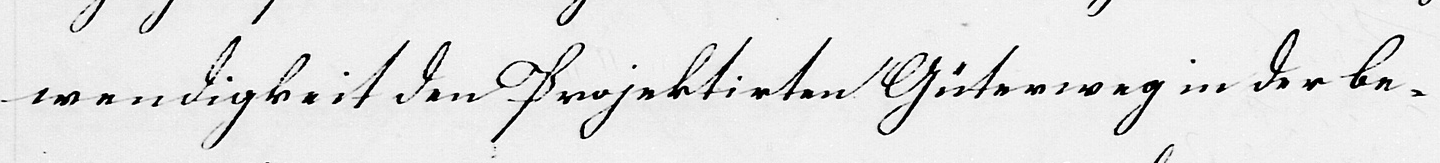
wendigkeit den Projektirten Güterweg in der be¬
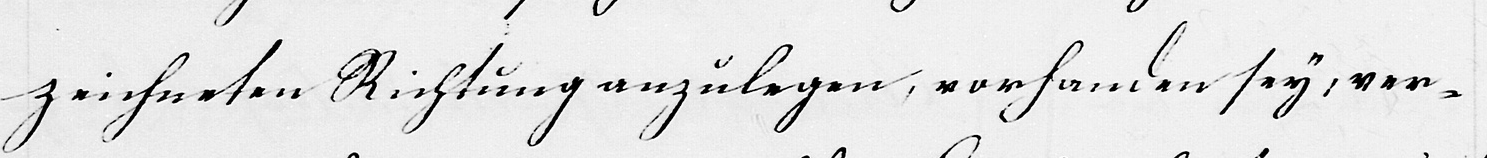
zeichneten Richtung anzulegen, vorhanden sey, ver¬
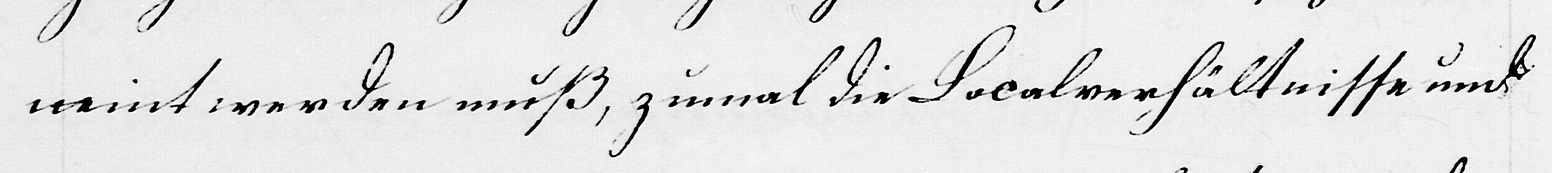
neint werden muß, zumal die Localverhältnisse und
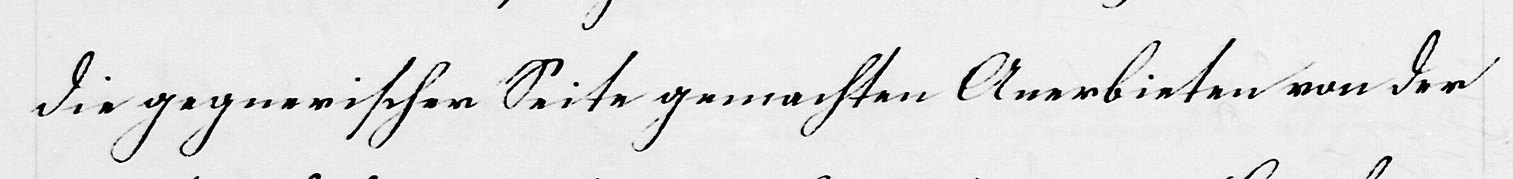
die gegnerischer Seite gemachten Anerbieten von der
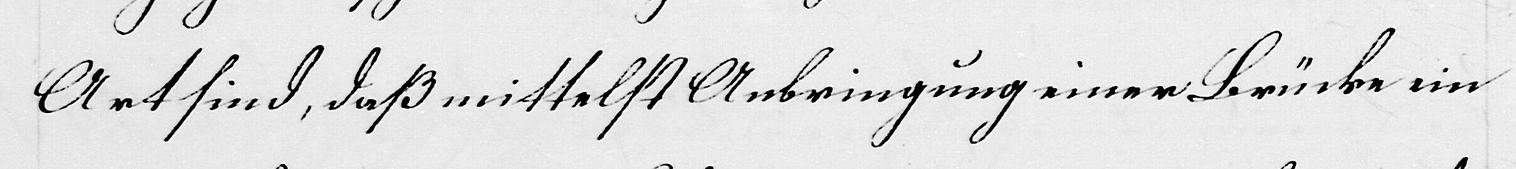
Art sind, daß mittelst Anbringung einer Brücke ein
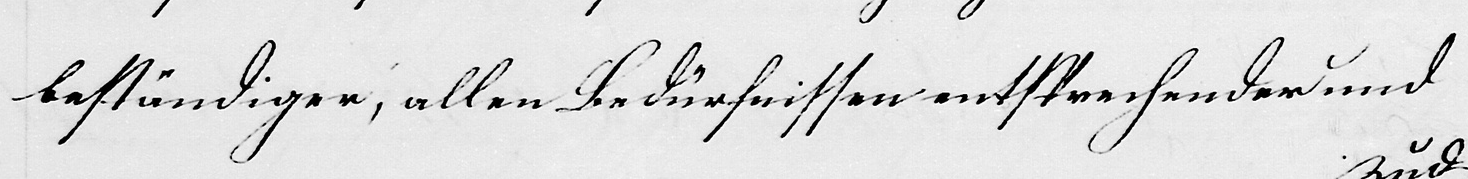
beständiger, allen Bedürfnissen entsprechender und
